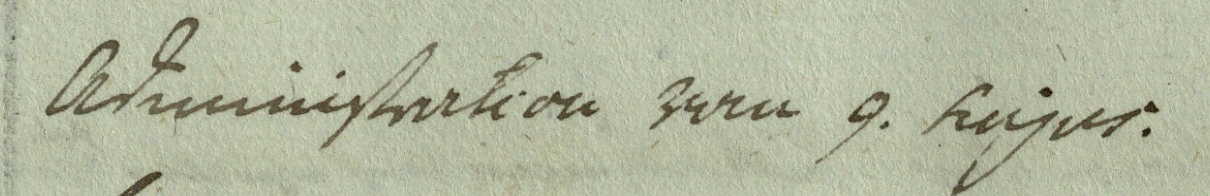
Administration vom 9. hujus.
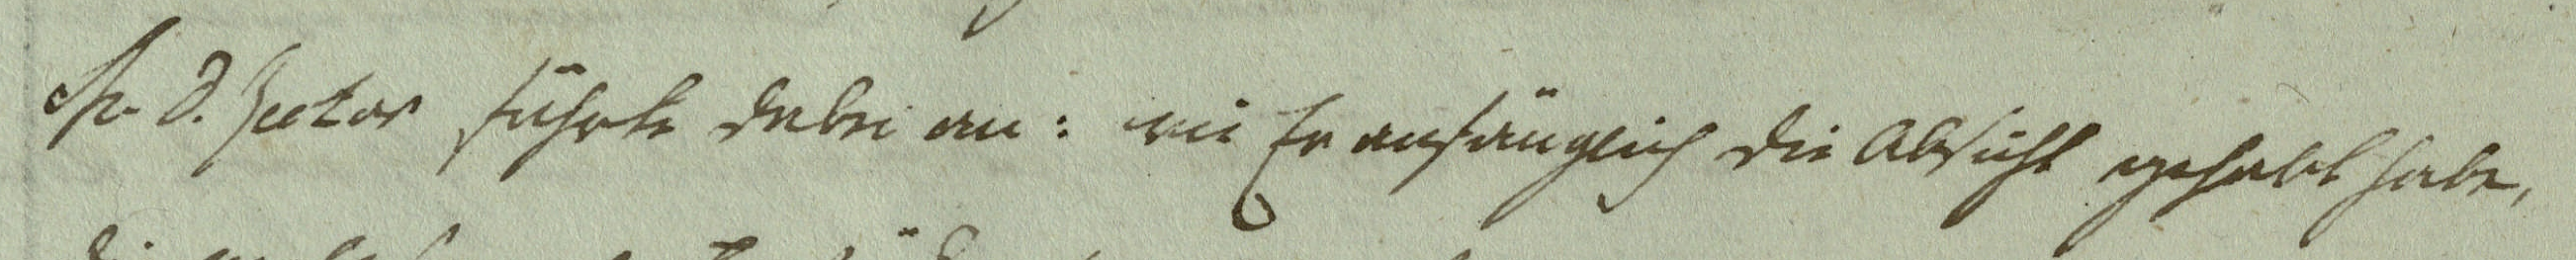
M. D. Rector führte dabei an: wie Er anfänglich die Absicht gehabt habe,
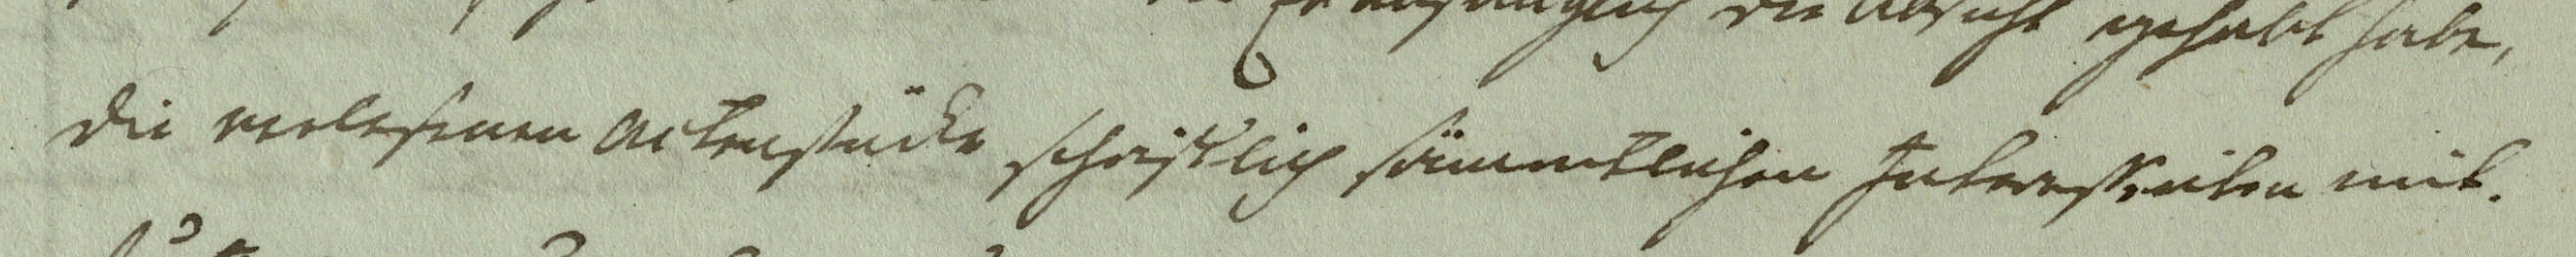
die verlesenen Actenstücke schriftlich sämmtlichen Interessirten mit¬
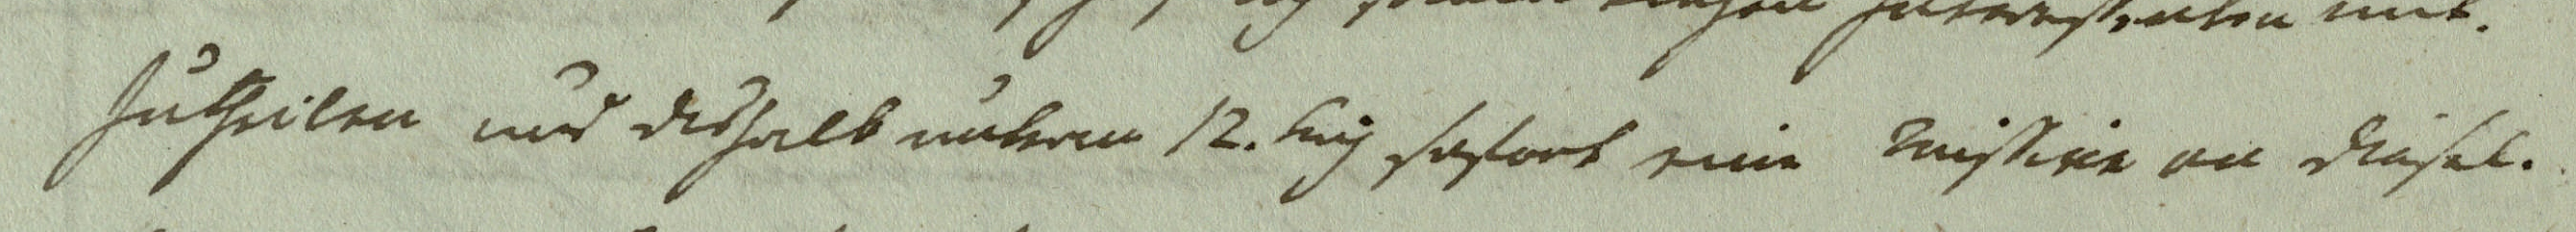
zutheilen und deshalb unterm 12. huj. sofort eine Missive an diesel¬
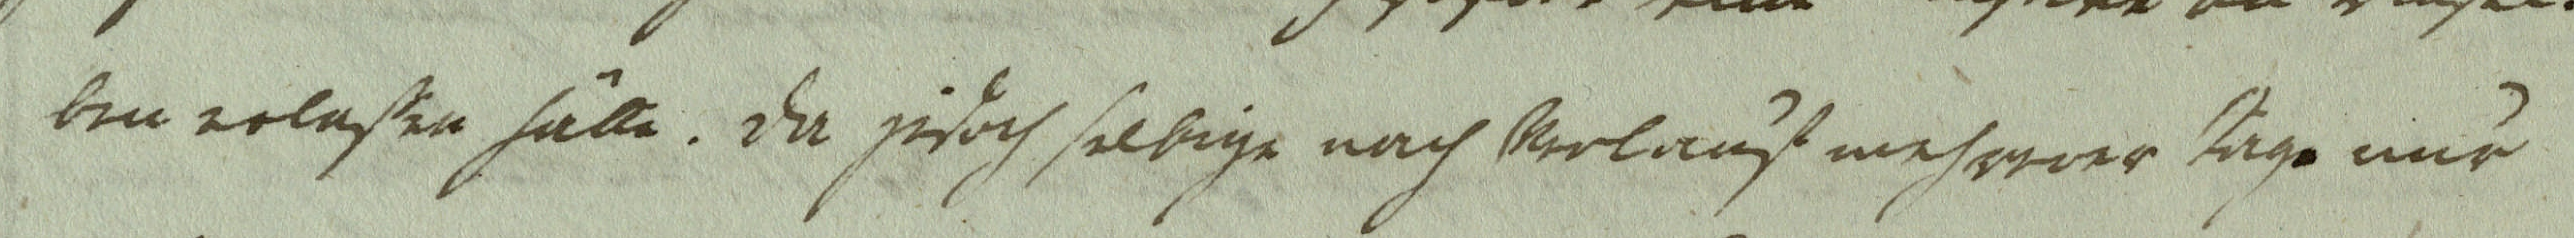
ben erlassen hätte. Da jedoch selbige nach Verlauf mehrerer Tage nur
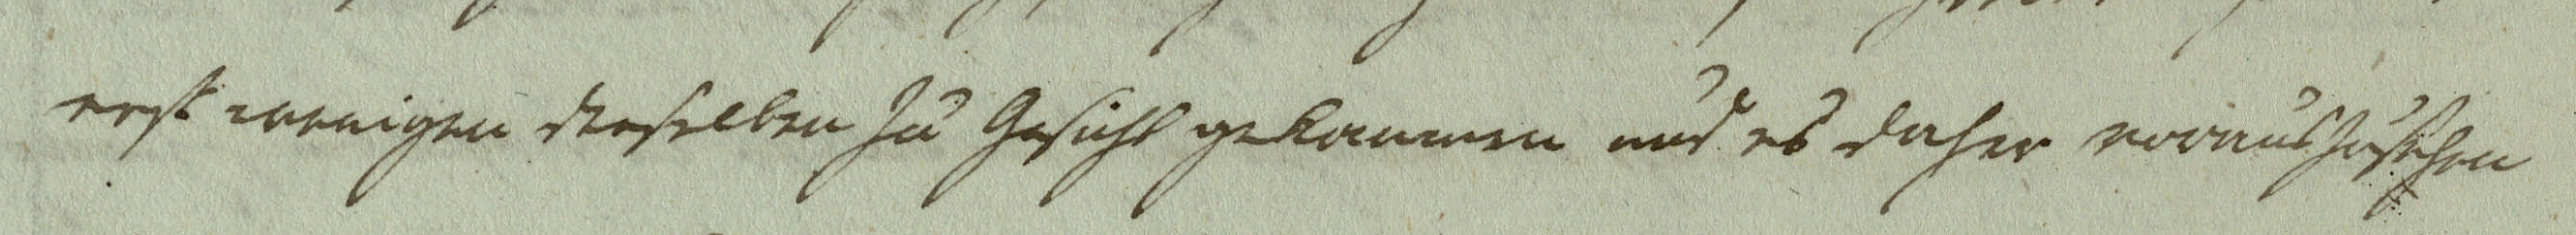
erst wenigen derselben zu Gesicht gekommen und es daher vorauszusehen
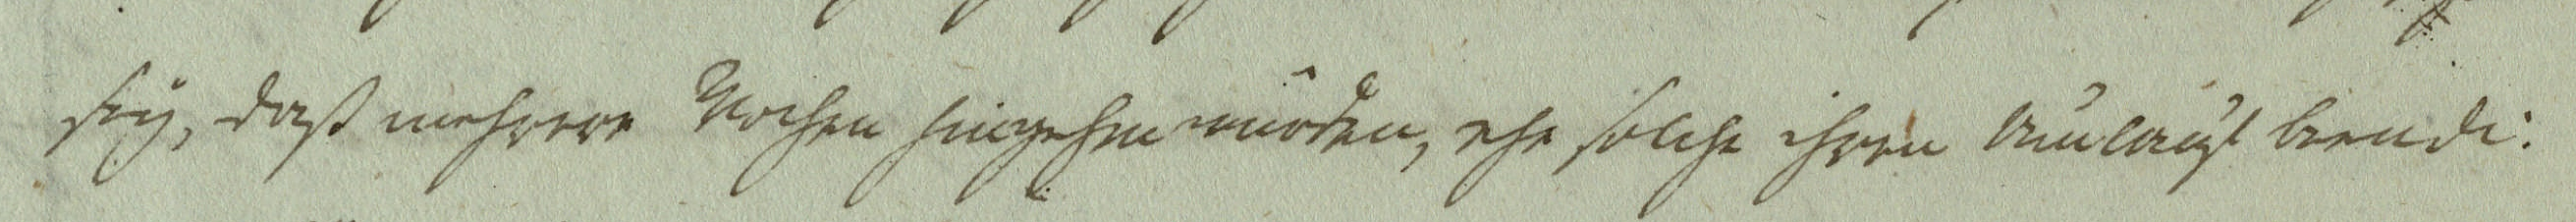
seÿ, daß mehrere Wochen hingehen würden, ehe solche ihren Umlauf beendi¬
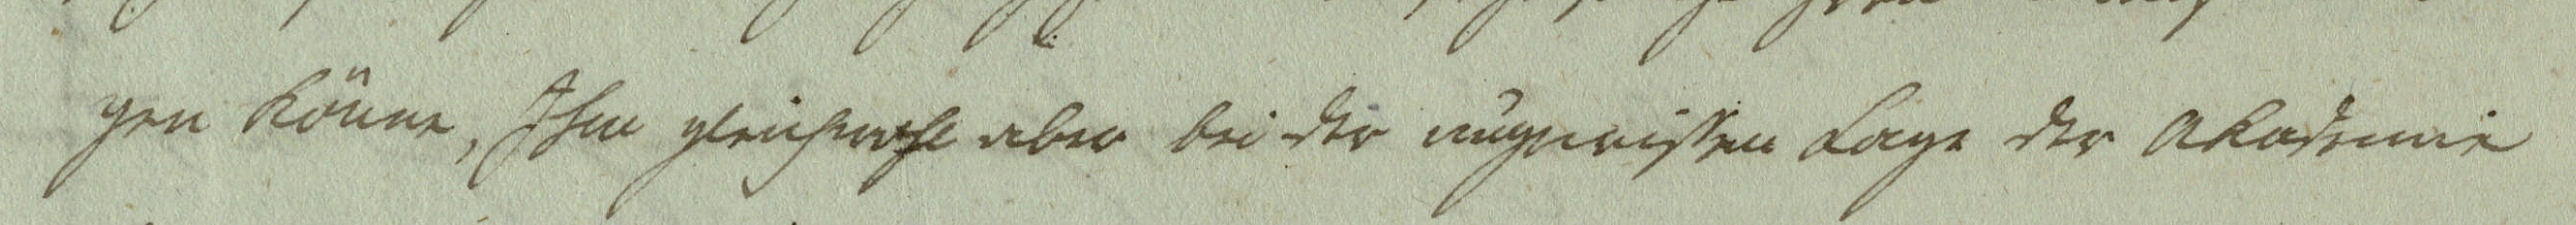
gen könne, Ihm gleichwohl aber bei der ungewissen Lage der Akademie
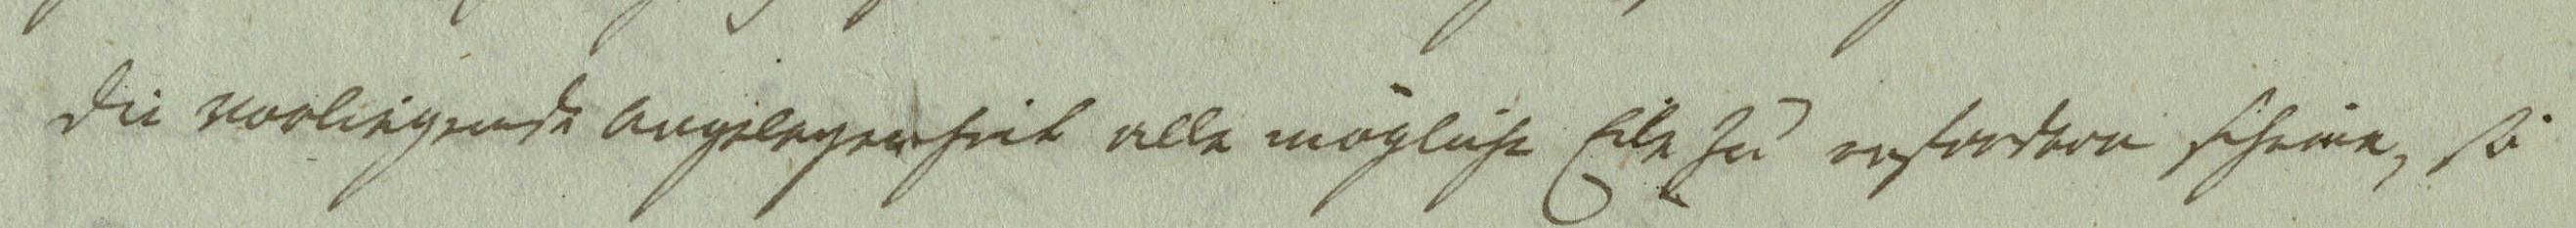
die vorliegende Angelegenheit alle mögliche Eile zu erfordern scheine, so
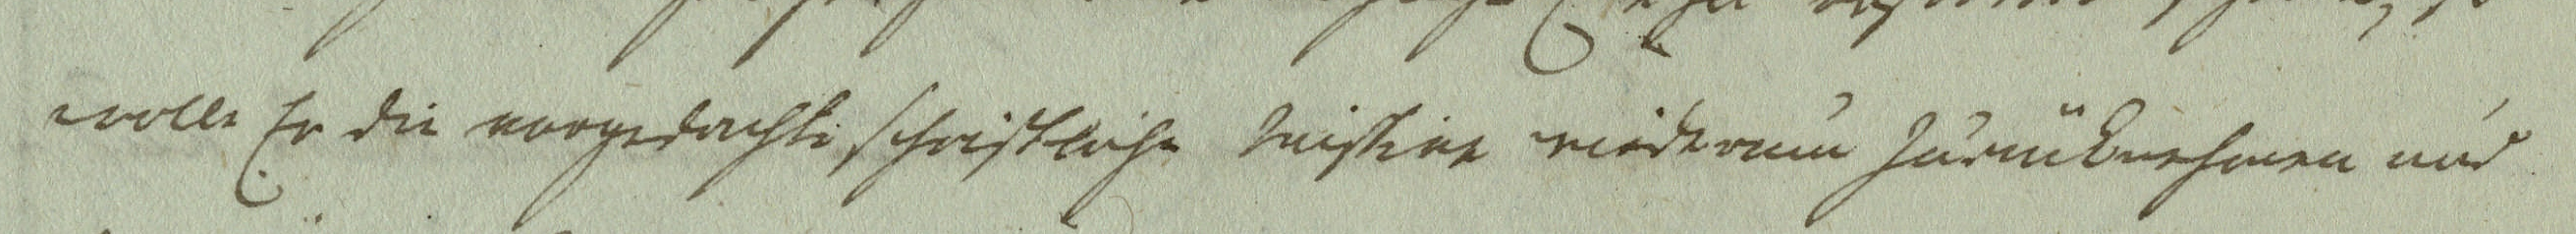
wolle Er die vorgedachte schriftliche Missive wiederum zurücknehmen und
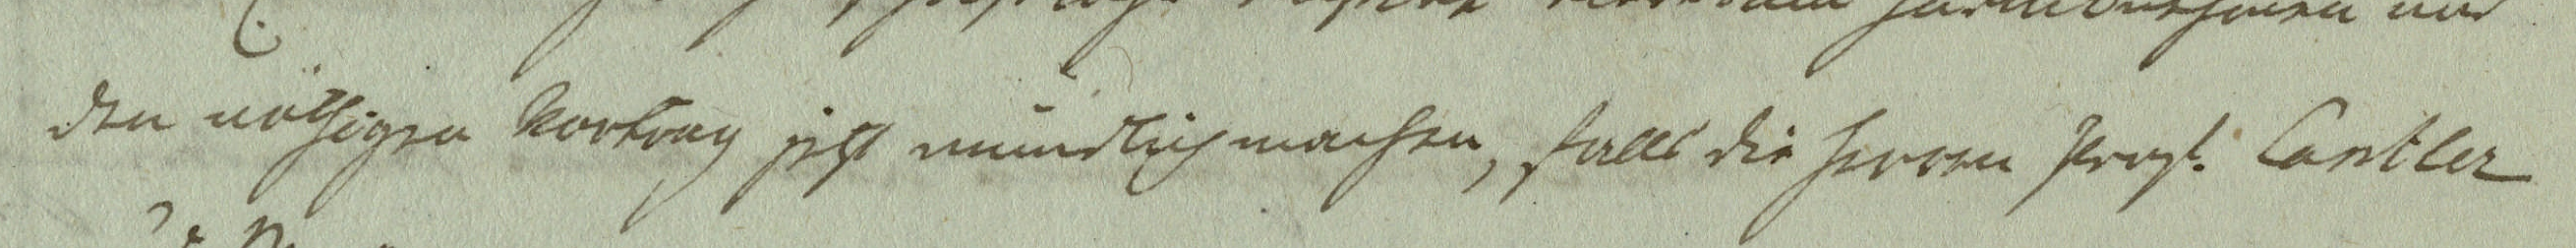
den nöthigen Vortrag jetzt mündlich machen, falls die herren Prof. Canzler
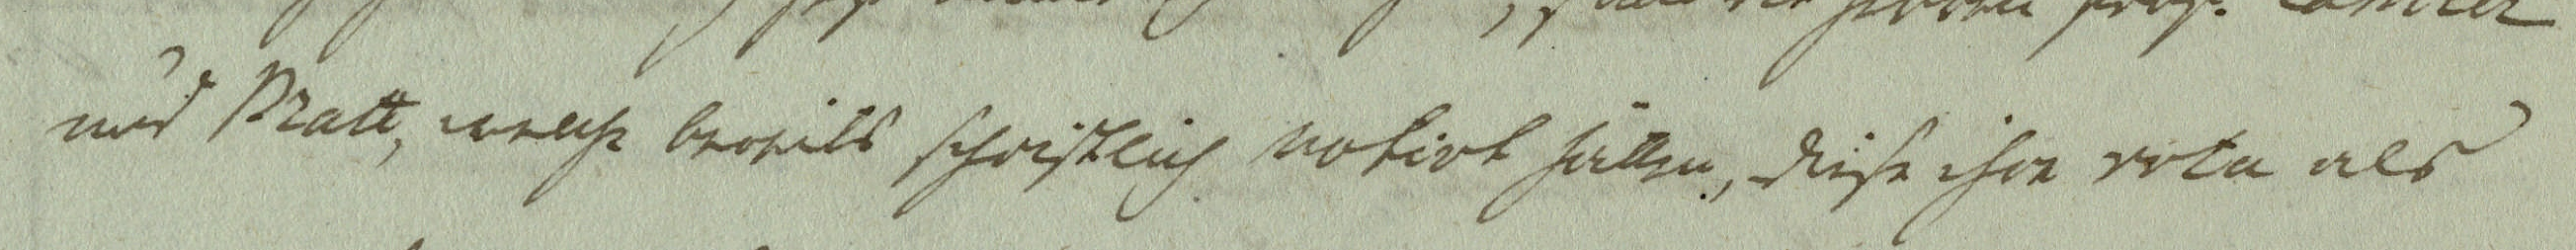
und Bratt, welche bereits schriftlich votirt hätten, diese ihre vota als
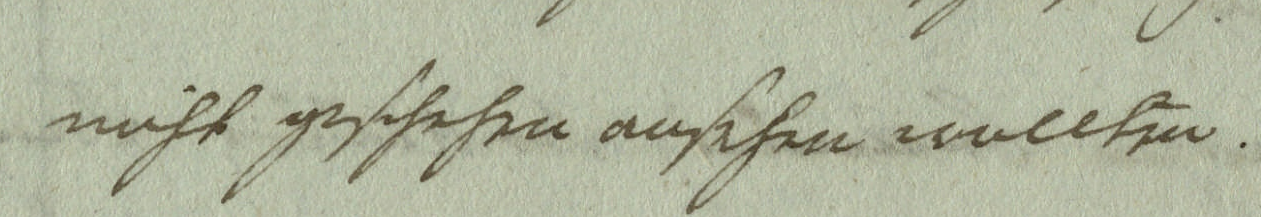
nicht geschehen ansehen wollten.
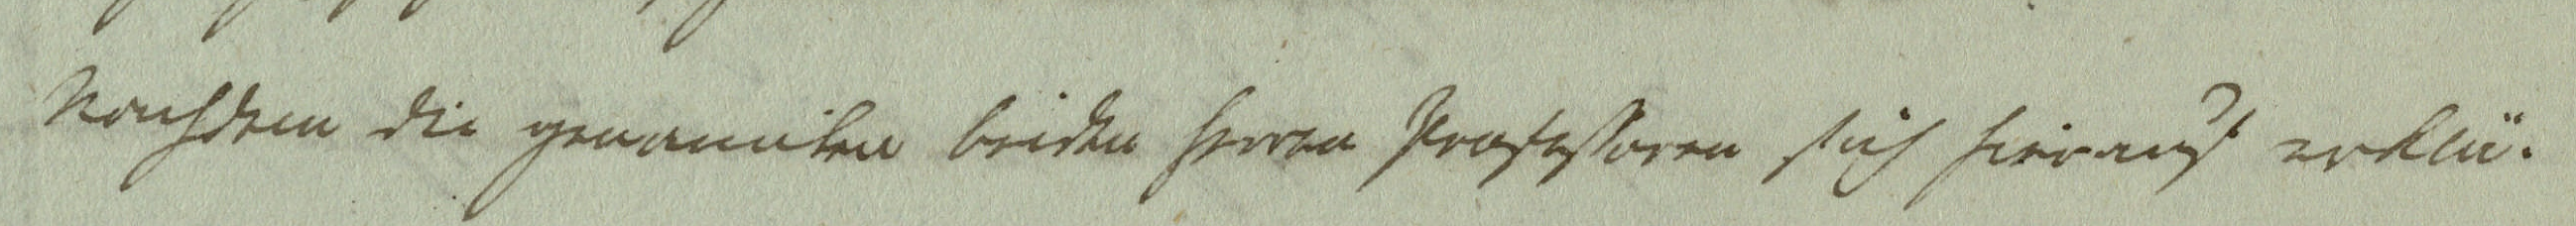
Nachdem die genannten beiden herren Professoren sich hierauf erklä¬
